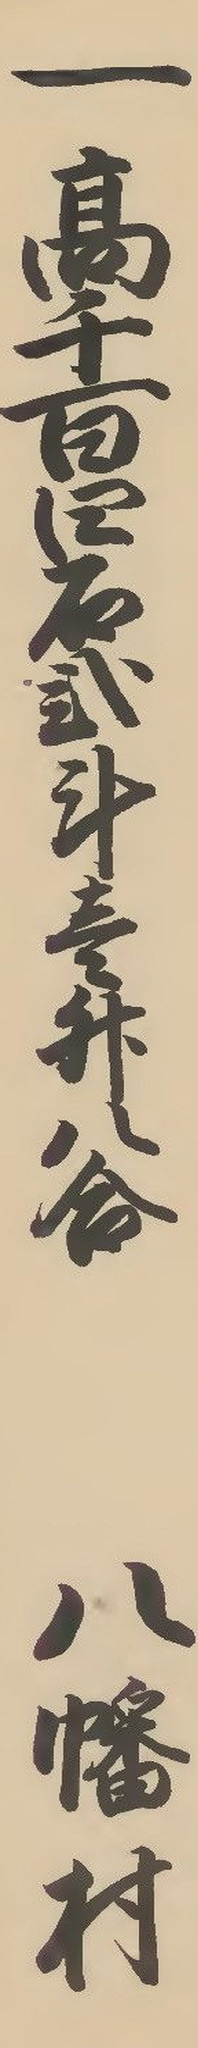一高千百四石弐斗壱升八合八幡村

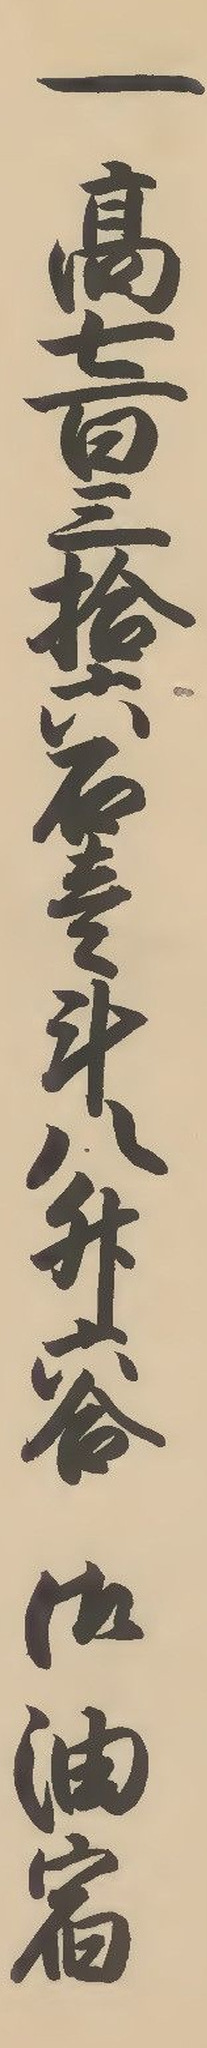一高七百三拾六石壱斗八升六合御油宿
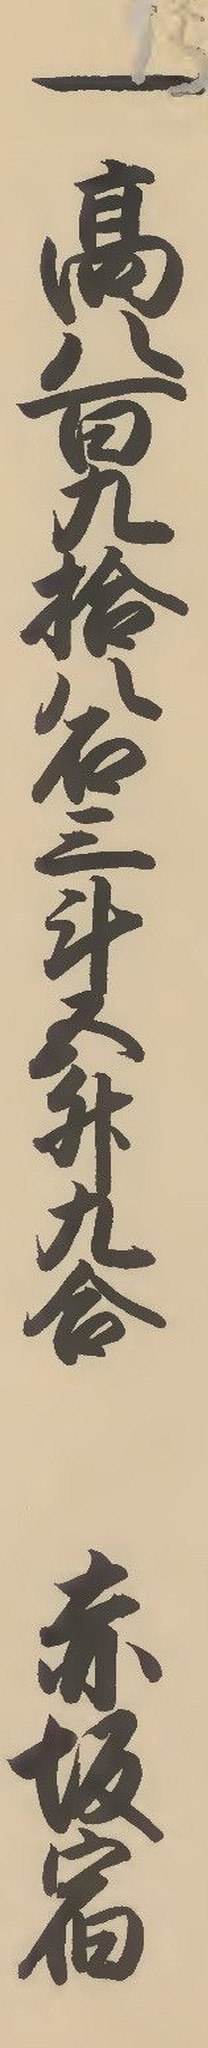一高八百九拾八石三斗五升九合赤坂宿
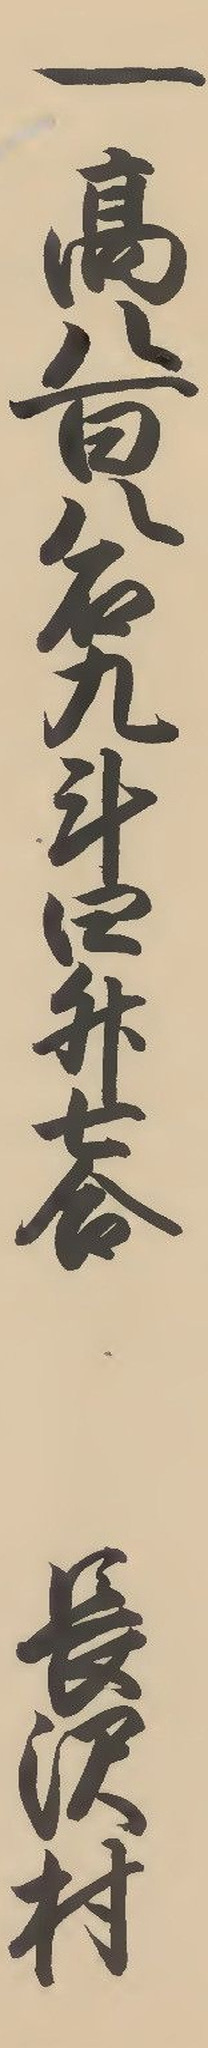一高八百八石九斗四升七合長沢村
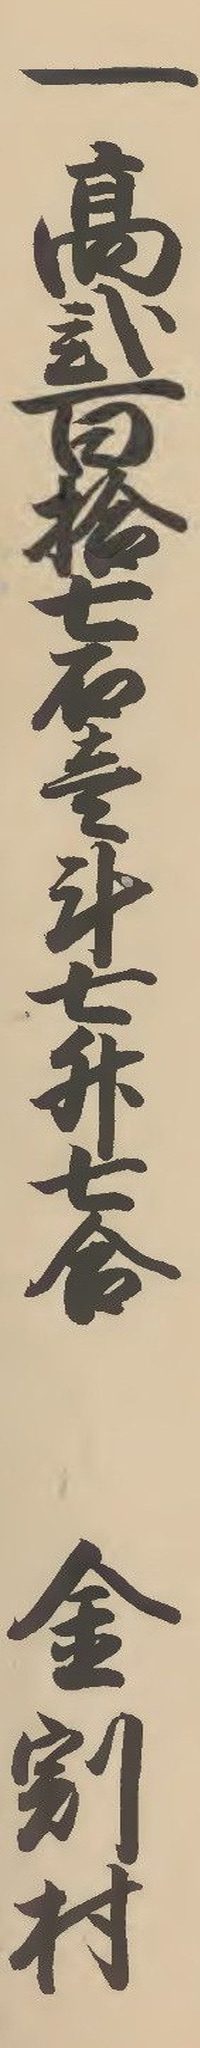一高弐百拾七石壱斗七升七合金割村
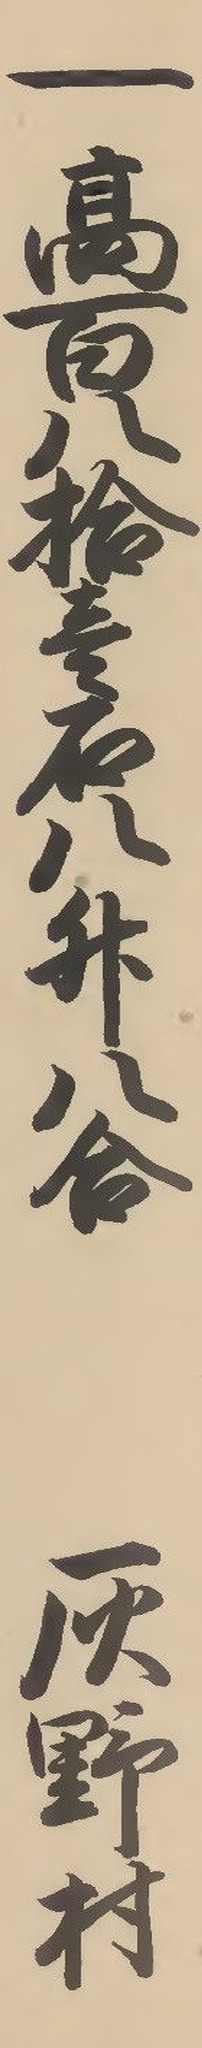一高百八拾壱石八升八合灰野村
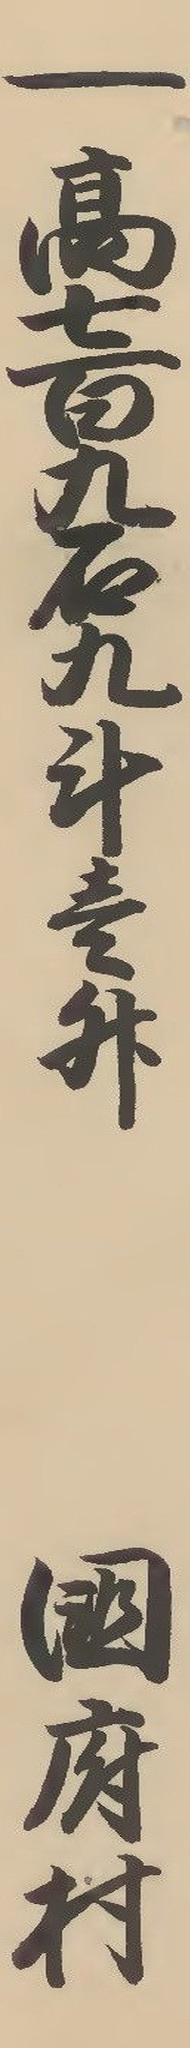一高七百九石九斗壱升国府村
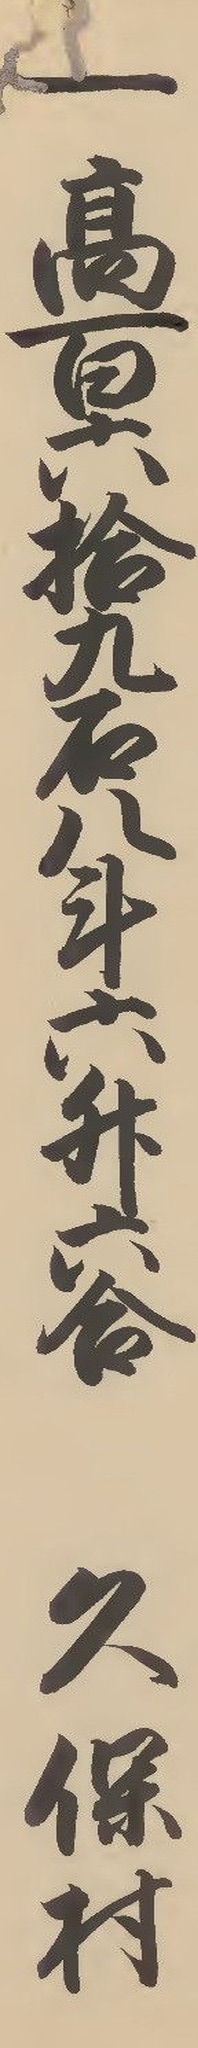一高百六拾九石八斗六升六合久保村
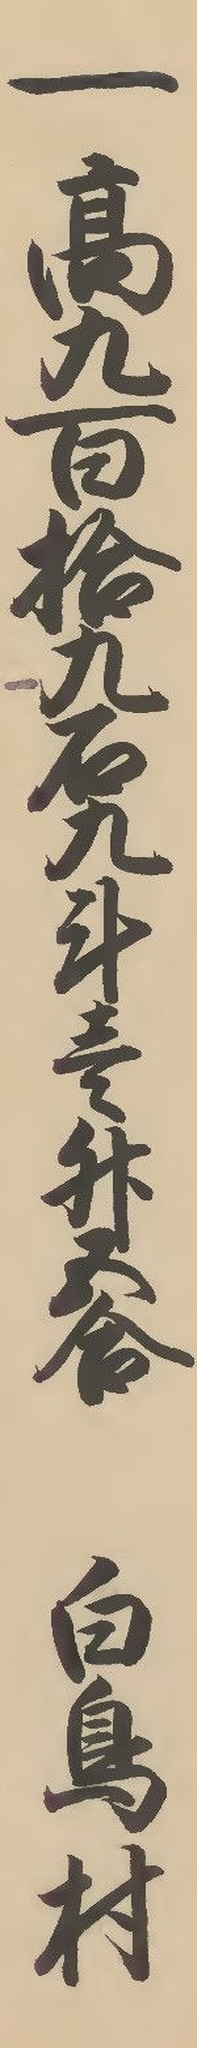一高九百拾九石九斗壱升五合白鳥村

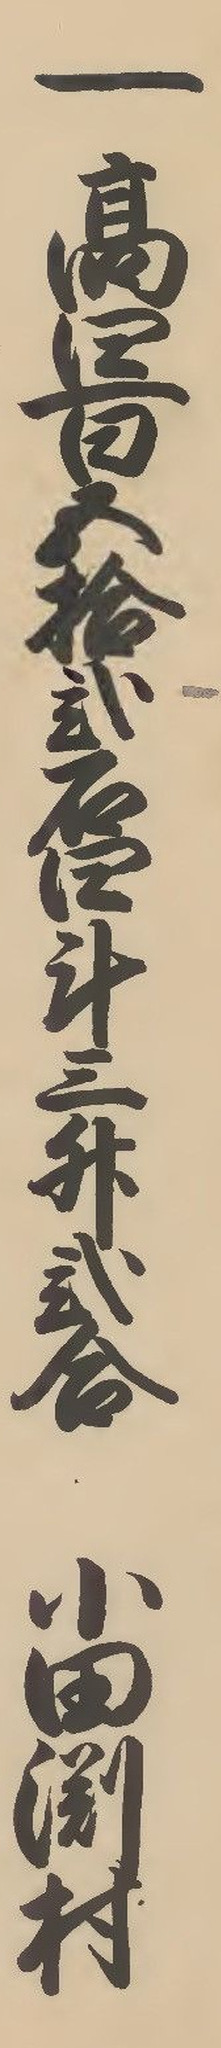一高四百五拾弐石四斗三升弐合小田渕村
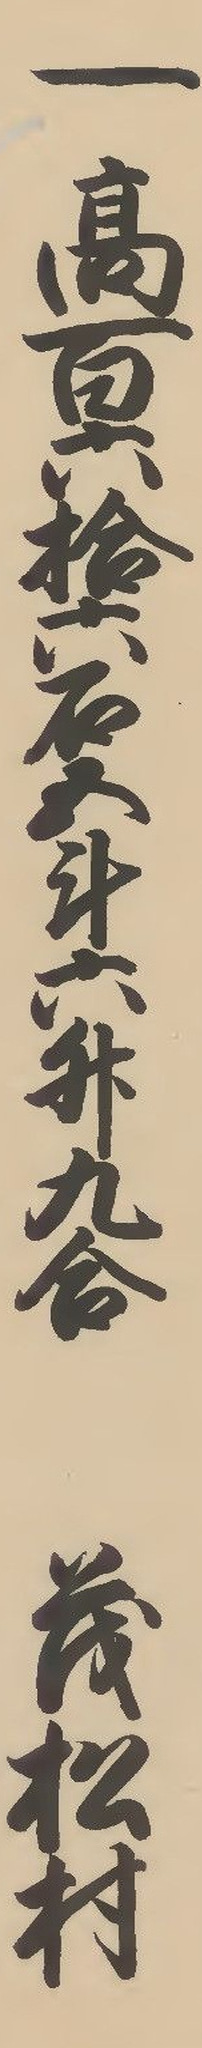一高百六拾六石五斗六升九合茂松村
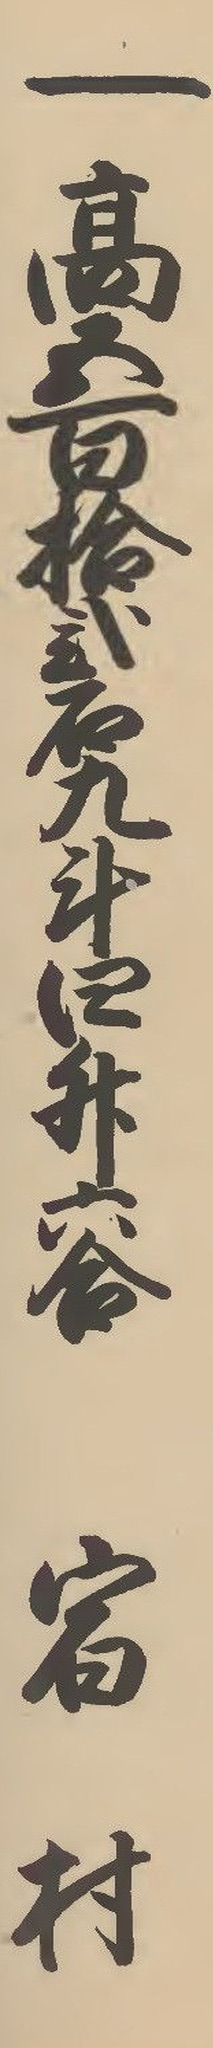一高五百拾弐石九斗四升六合宿村
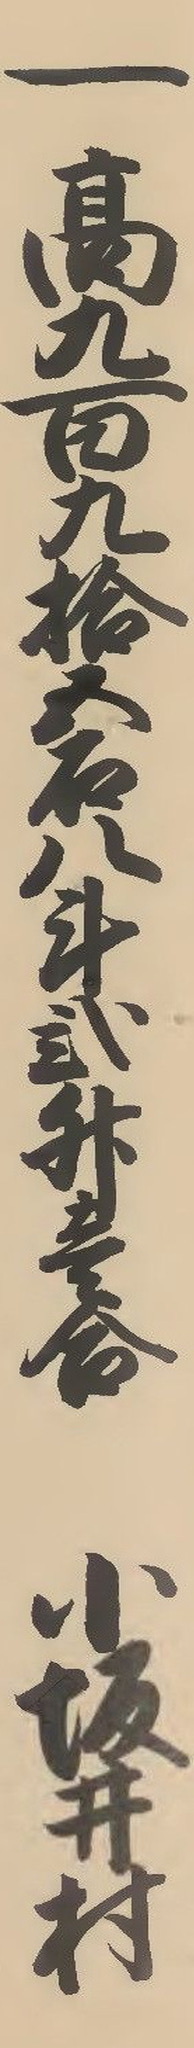一高九百九拾五石八斗弐升壱合小坂井村
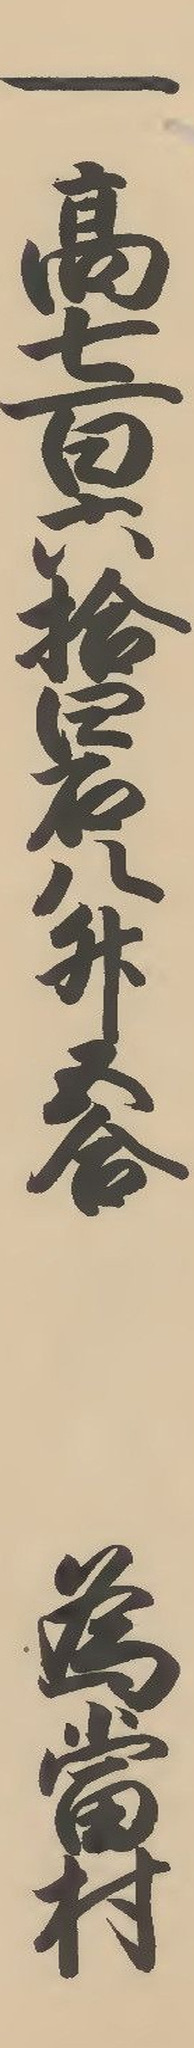一高七百六拾四石八升五合為当村
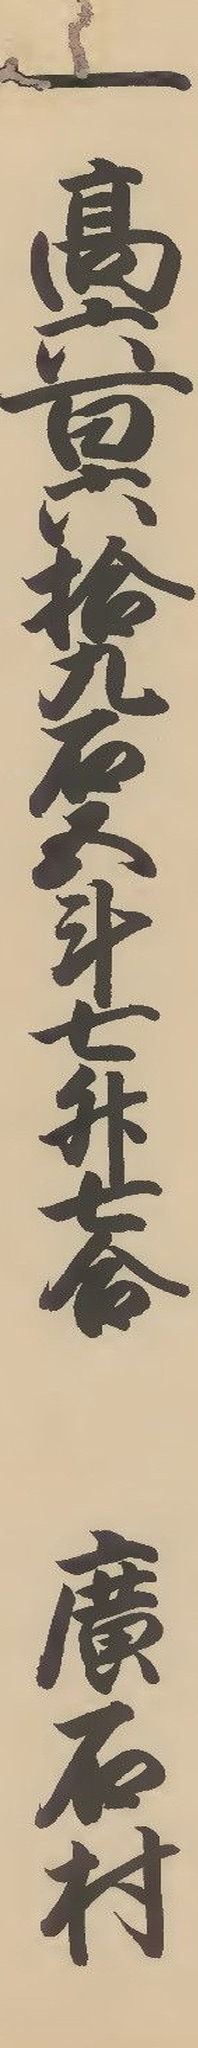一高六百六拾九石五斗七升七合広石村
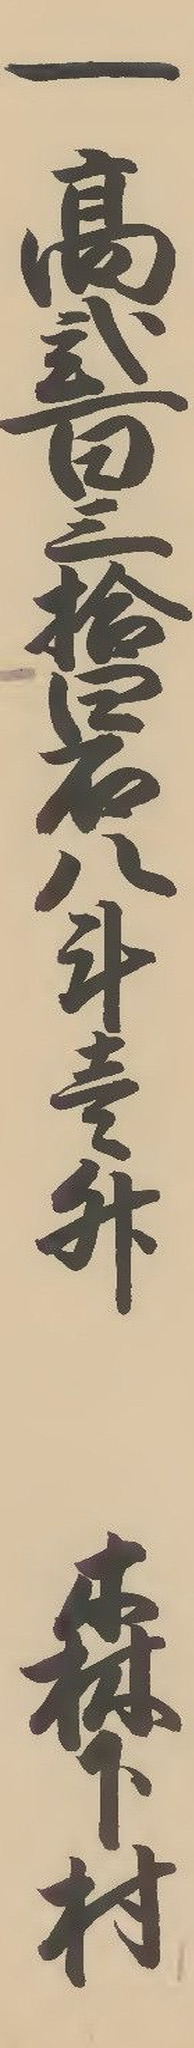一高弐百三拾四石八斗壱升森下村
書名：三河国郷帳
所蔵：国立公文書館 National Archives of Japan
